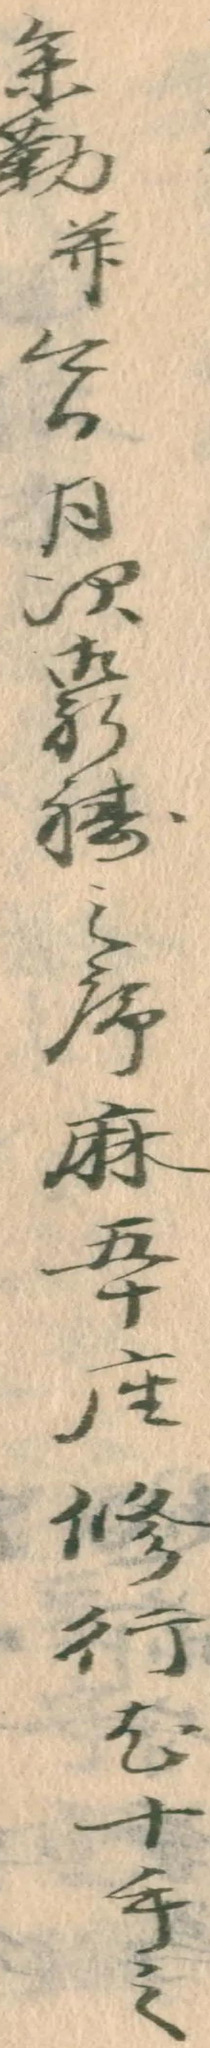参勤并今日月次御祈祷之席麻五十座修行尤十手之
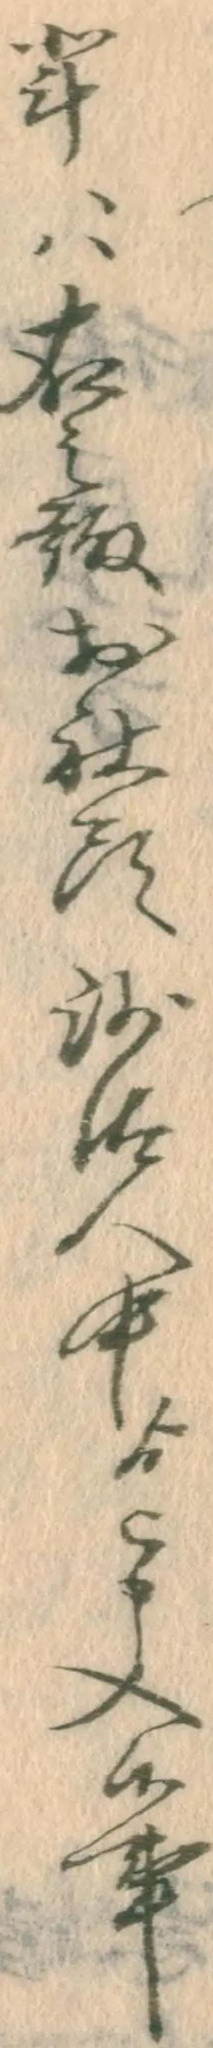輩ヘハ右之趣於社頭沙汰人中ゟ被申入候事
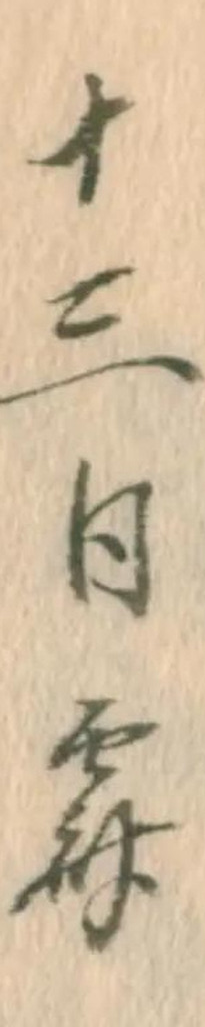十三日霽
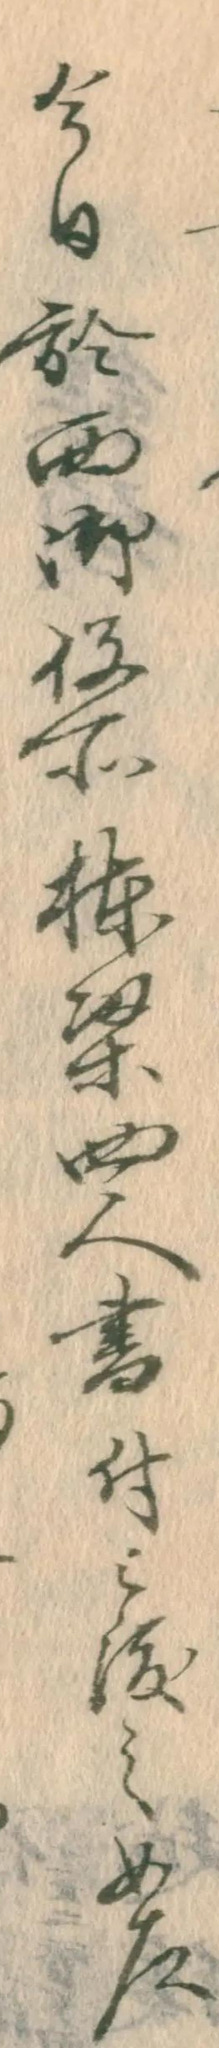一今日於西御役所棟梁四人書付被渡之如左
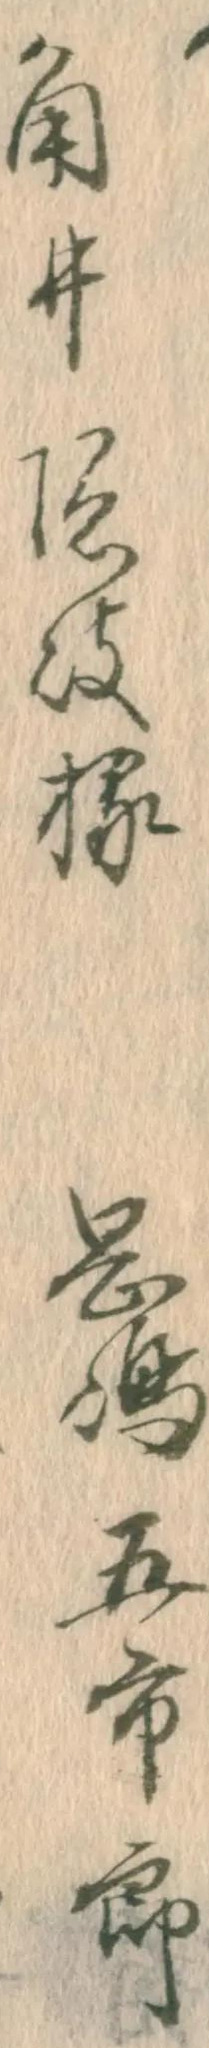角井隠岐様岡嶋五市郎
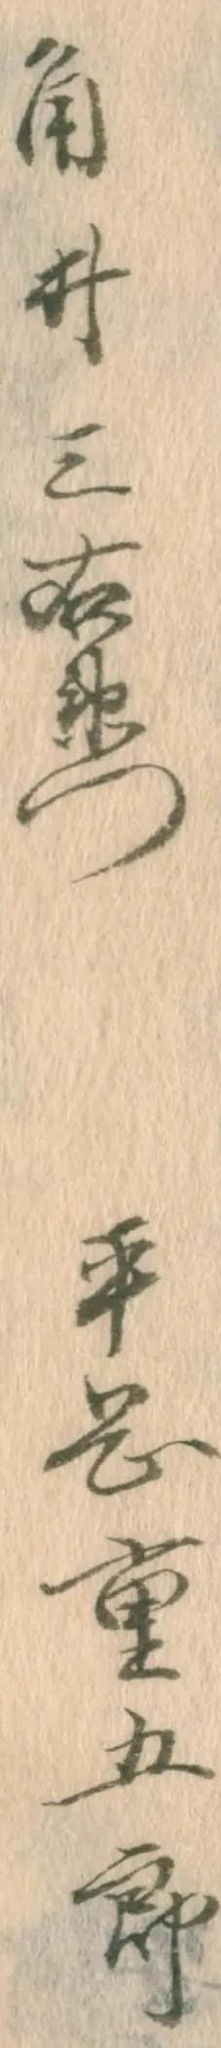角井三右衛門平岡重五郎
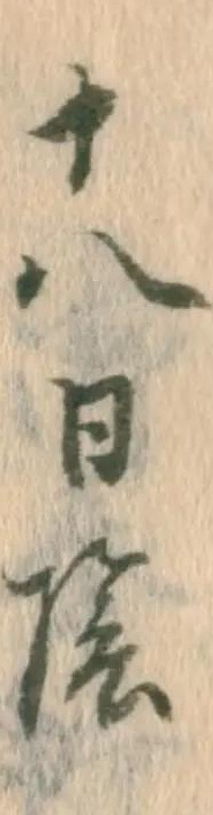十八日陰
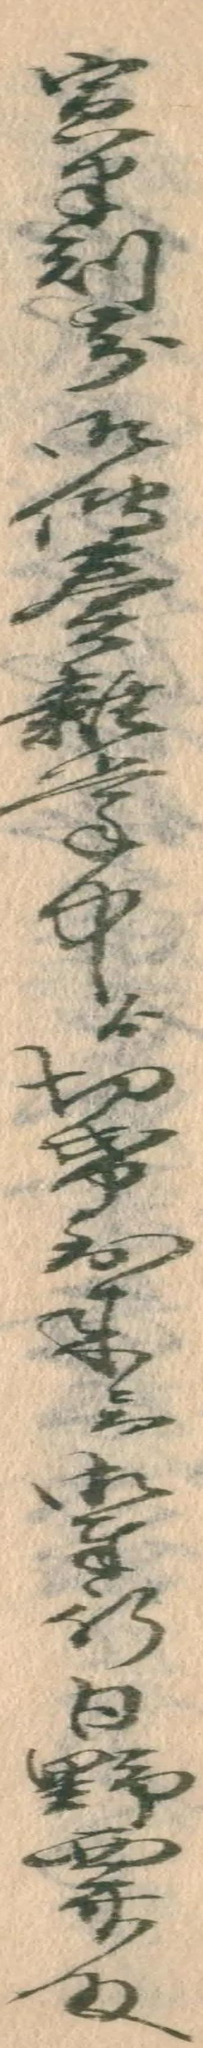一寅半刻前御伝奏雑掌中ゟ切帋到来ニ而御奉行日野西弁殿
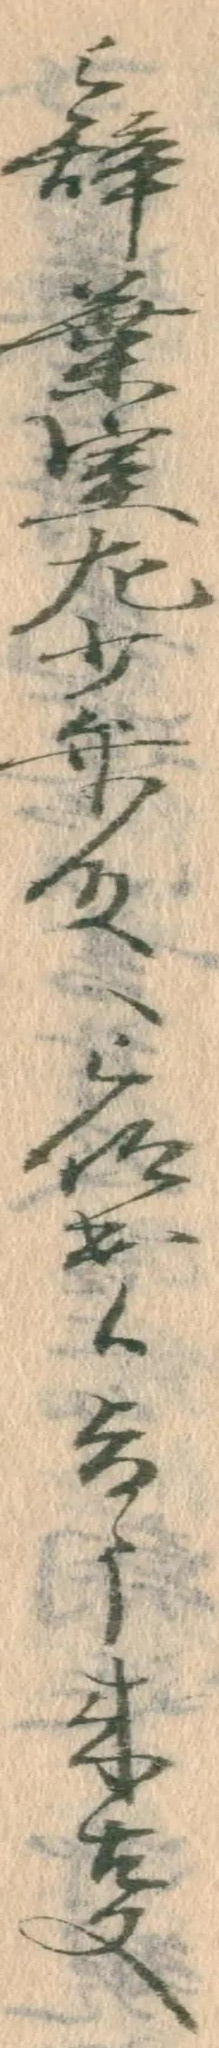之辞葉室左少弁殿へ被仰出候旨申来事
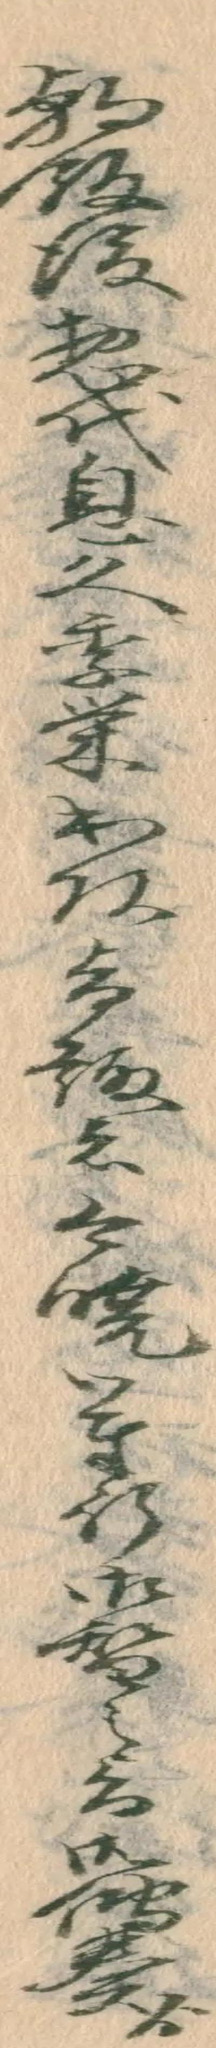一朝飯後惣代息久季栄出頭旨趣は今暁御奉行御替之旨御伝奏ゟ
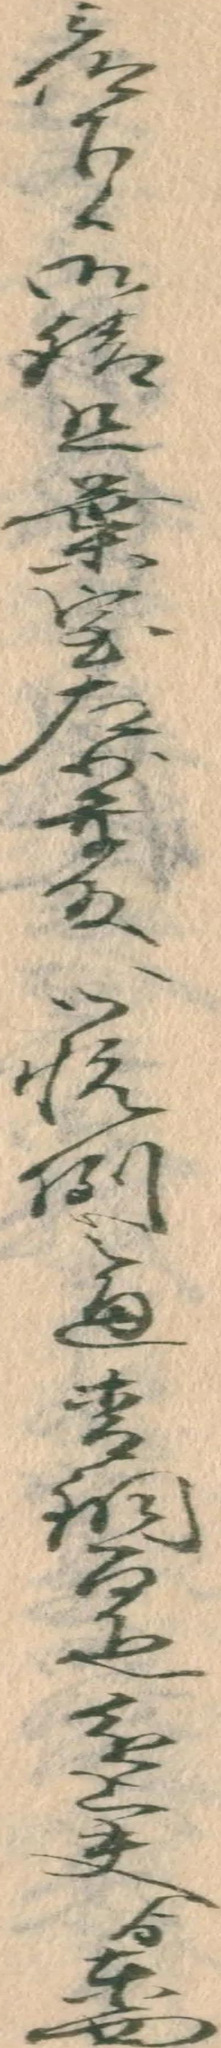被仰下候御鎮且葉室左少弁殿へ御悦例之通青銅百疋進上夫ゟ東西
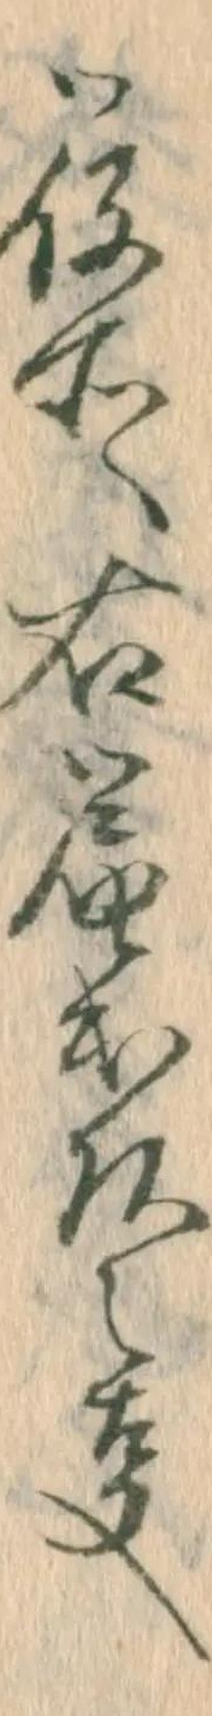御役所へ右御届出頭之事
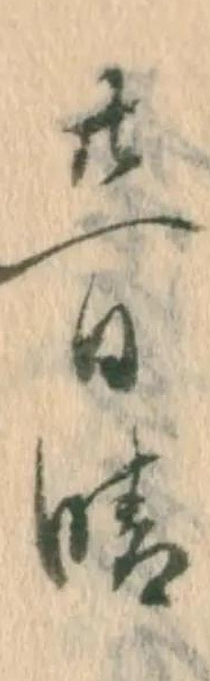廿一日晴
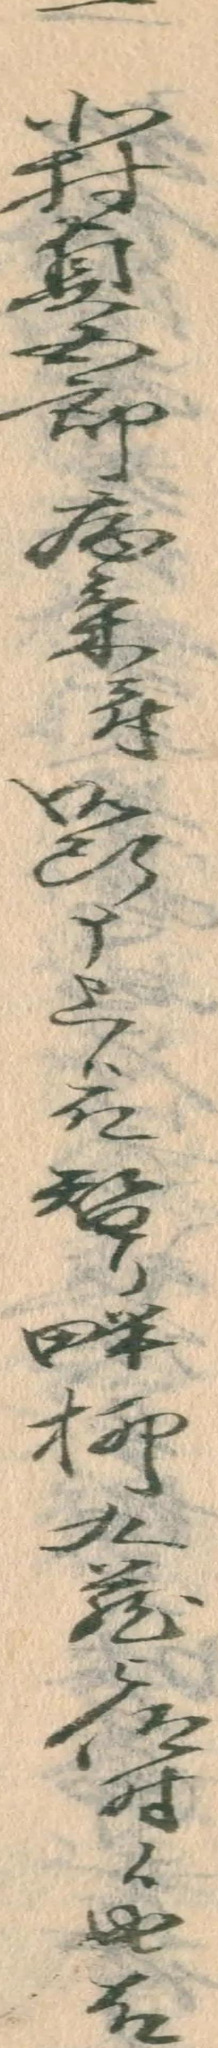一北村貞五郎病気ニ付御断申上候故替り畔柳九蔵被仰付候由故
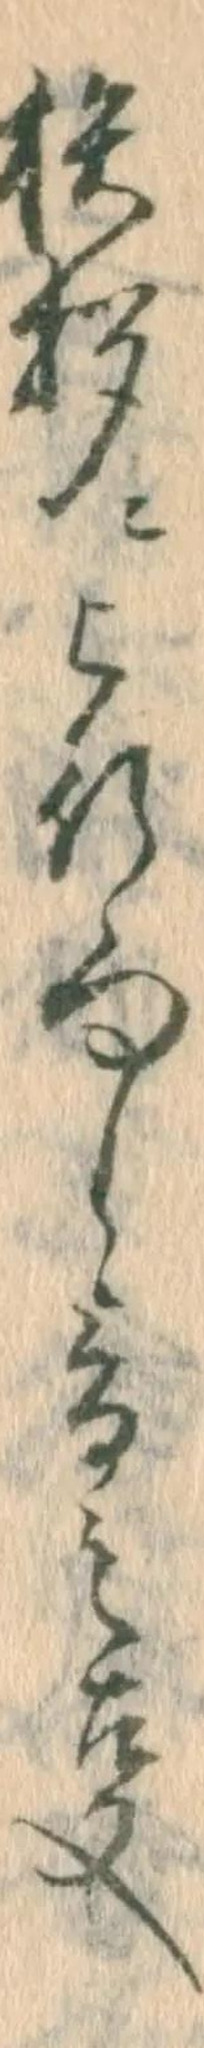挨拶ニ被行向候旨之事
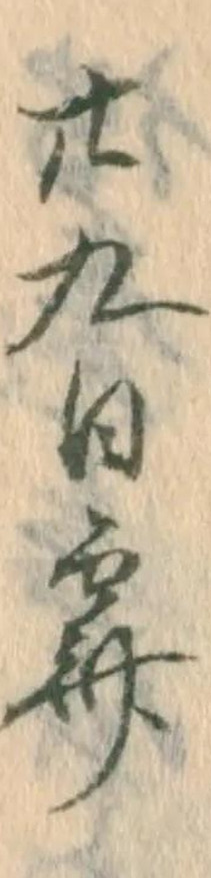廿九日霽
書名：賀茂社記録. 第17冊
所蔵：国立国会図書館 National Diet Library, JAPAN
